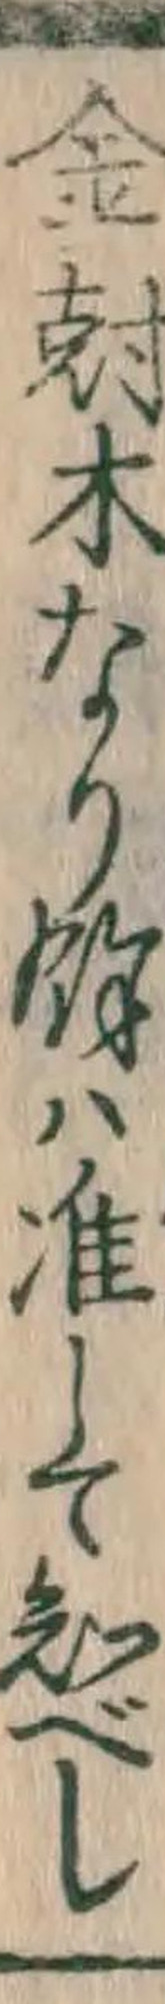金剋木なり余は准して知べし
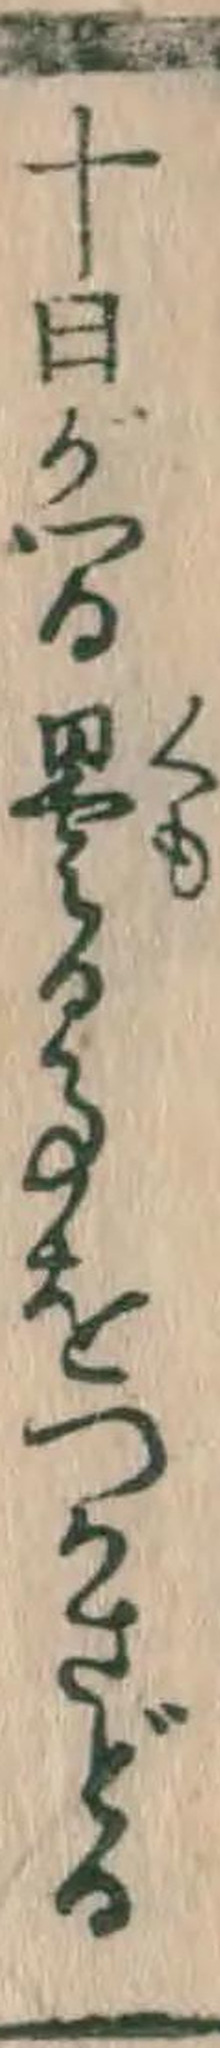十日が間曇る事をつかさどる
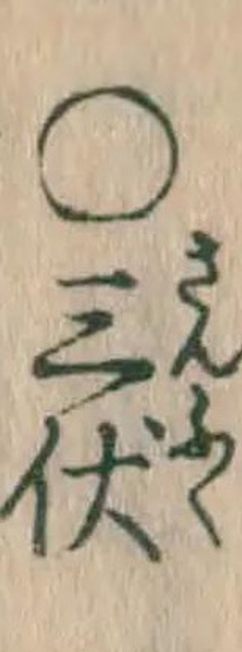○三伏
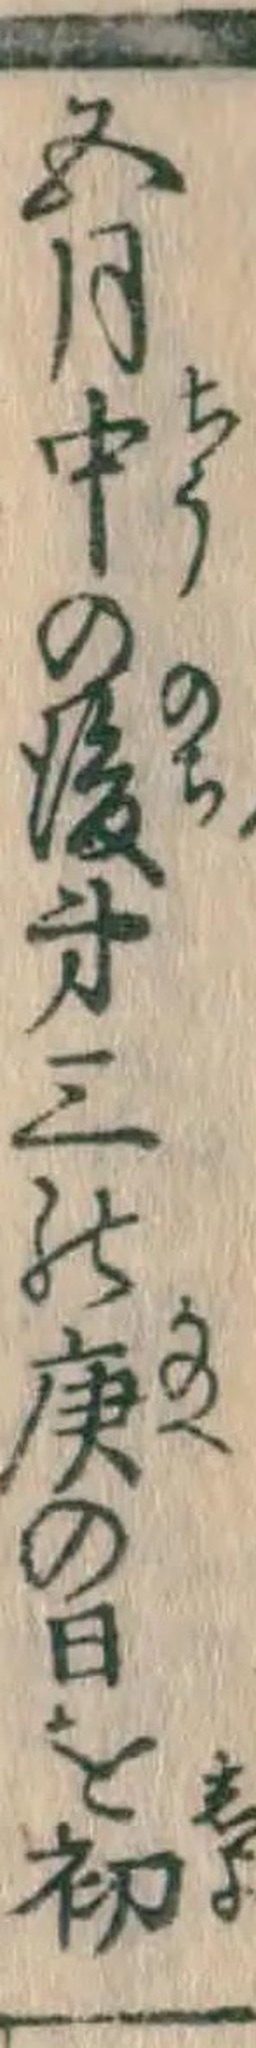五月中の後第三の庚の日を初
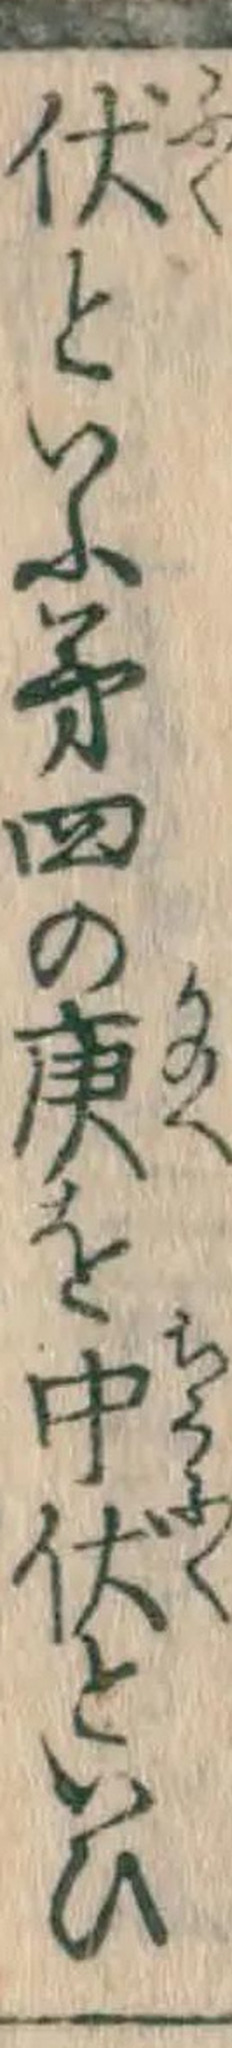伏といふ第四の庚を中伏といひ
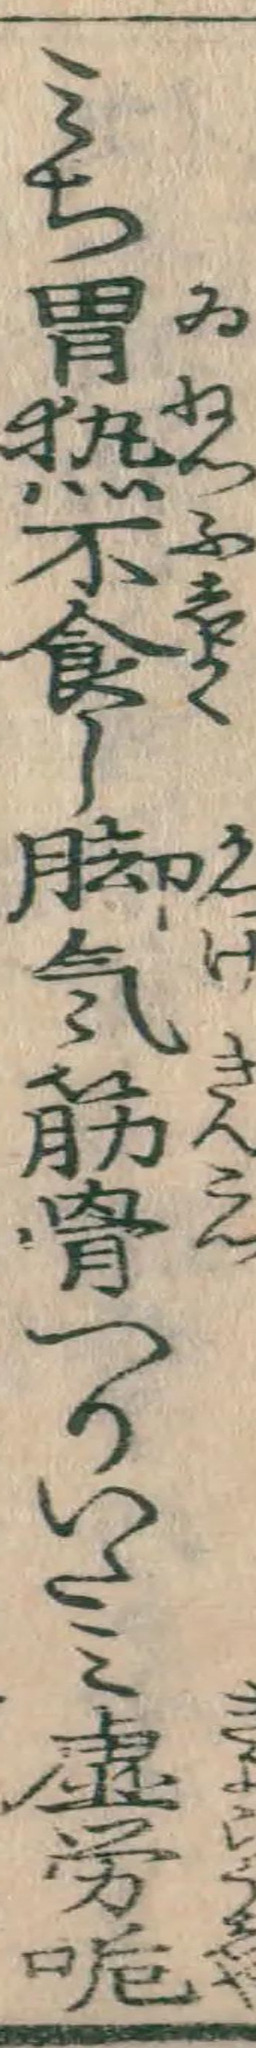みち胃熱不食し脚気筋骨つりいたみ虚労𠲪
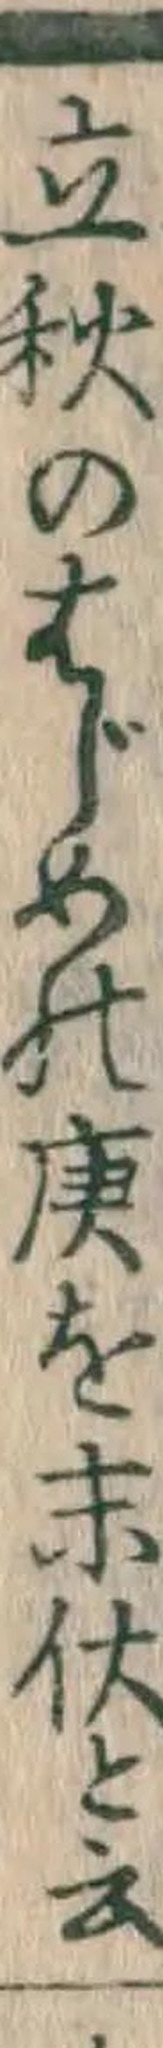立秋のはじめの庚を末伏と云
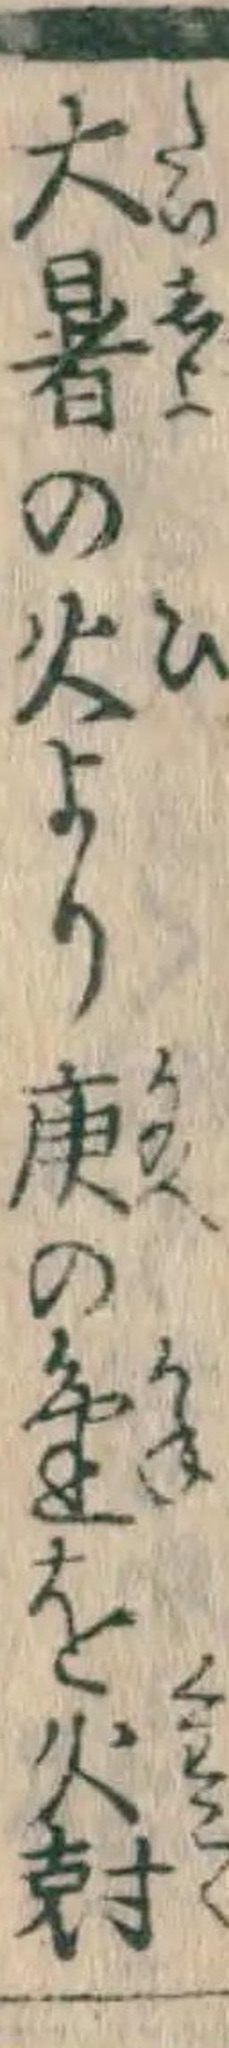大暑の火より庚の金を火剋
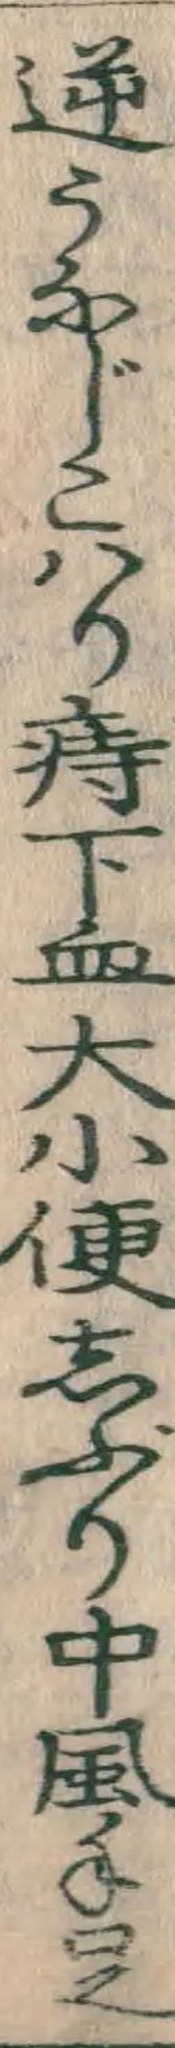逆うなじこはり痔下血大小便しぶり中風手足
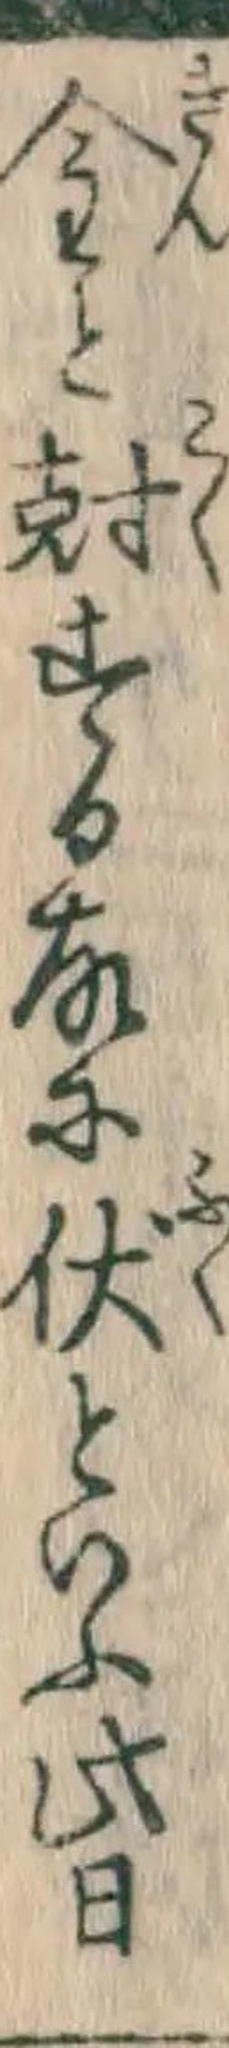金と剋する故に伏といふ此日
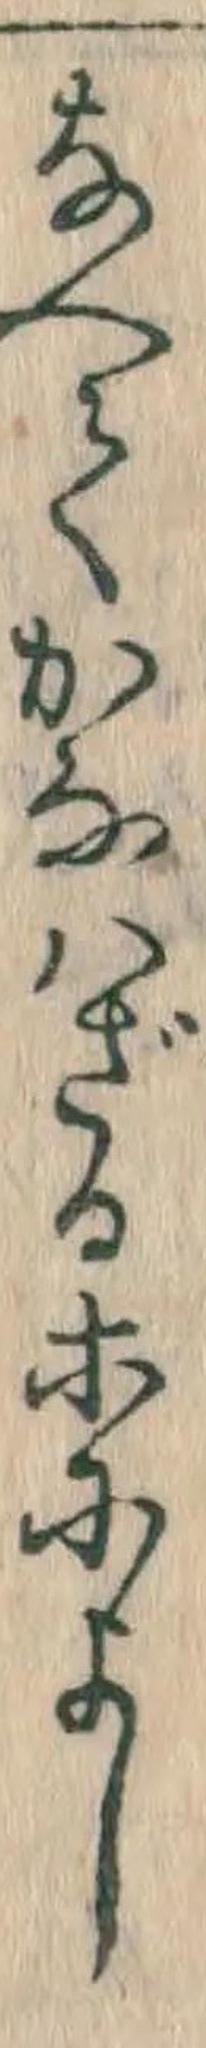なへてかなはざる等によし
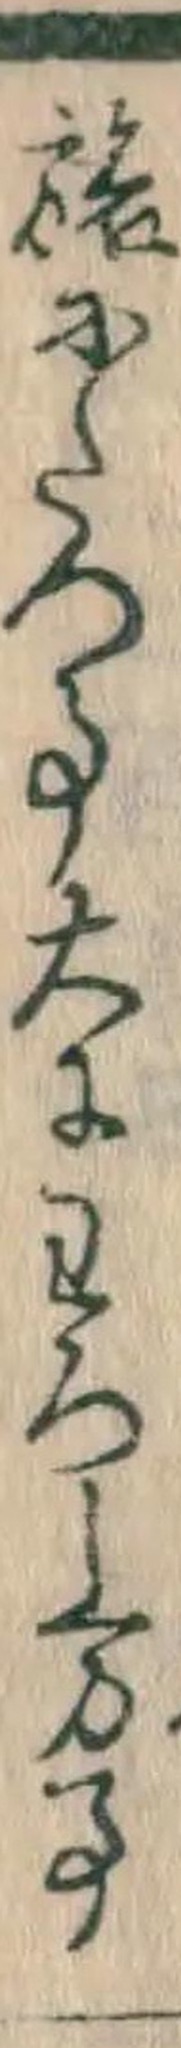旅にたつ事大にわろし万事
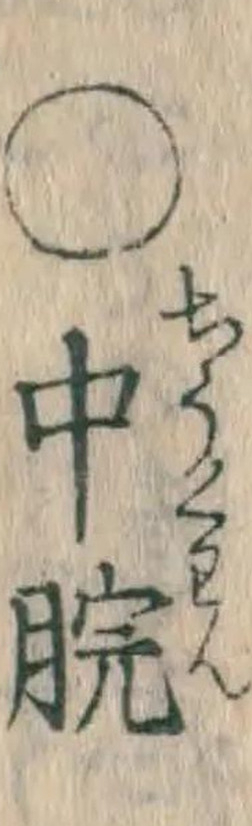○中脘
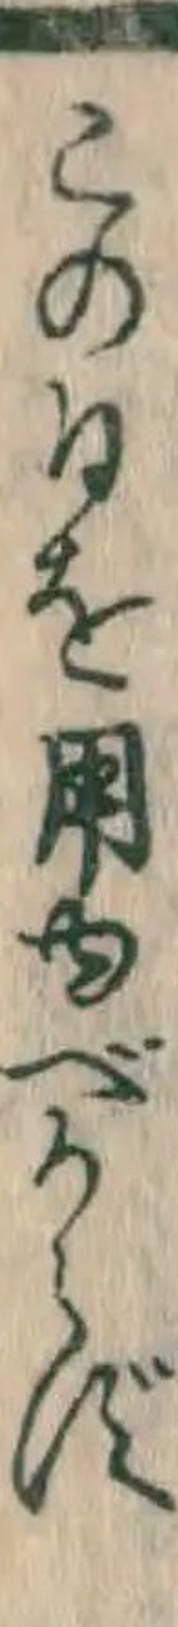この日を用ゆべからず
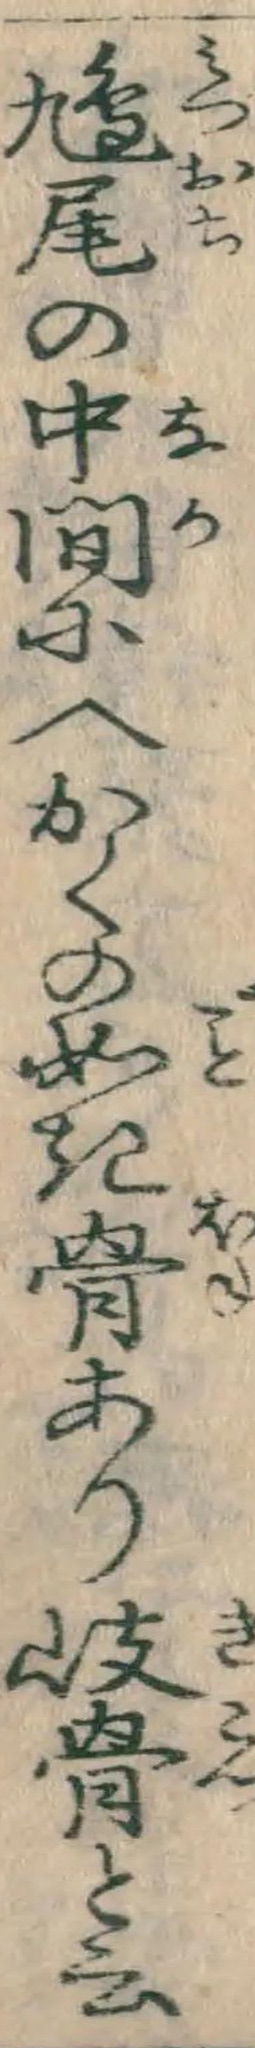鳩尾の中間に𠆢かくの如き骨あり岐骨と云
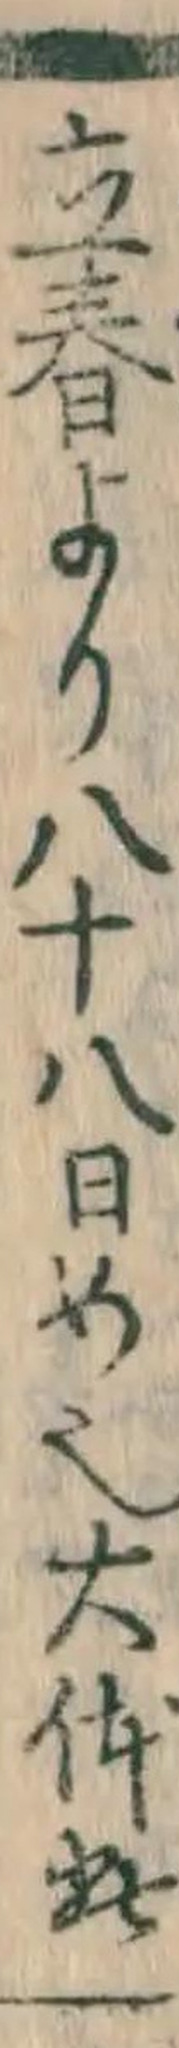立春より八十八日め也大体此
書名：広益秘事大全 3巻. [4]
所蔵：国立国会図書館 National Diet Library, JAPAN
